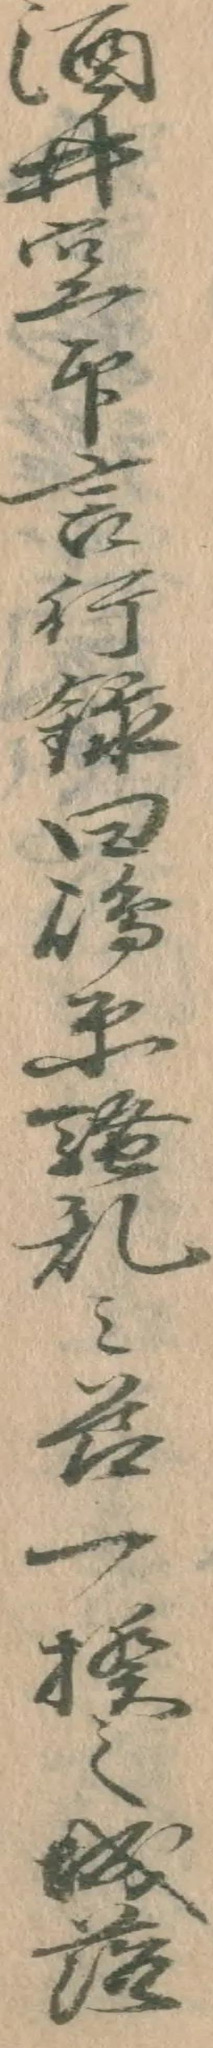酒井空印言行録曰島原騒乱之節一揆之城落
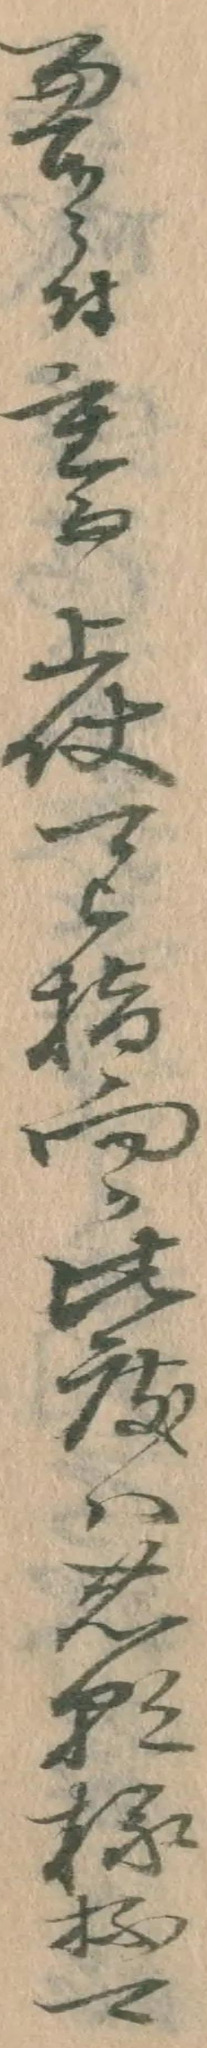兼候に付重而上使可被指向か此度は忠頼様抔可
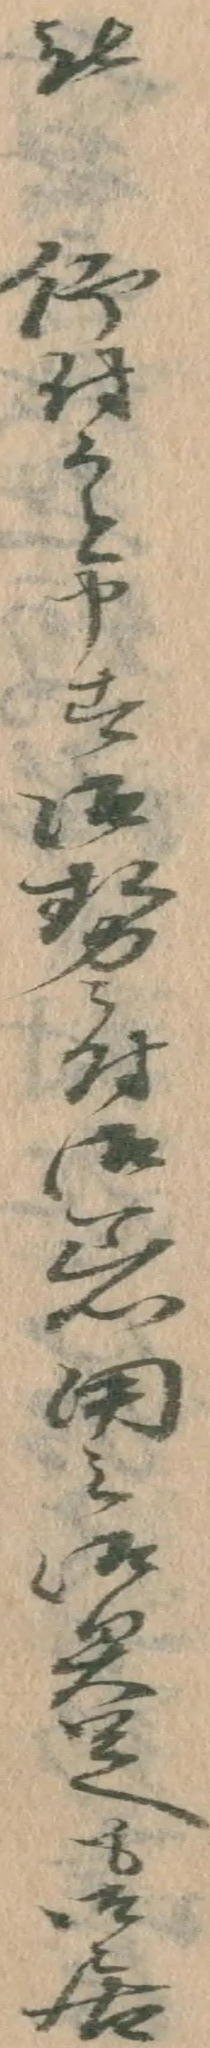被仰付かと申す御勢に付御着用之御具足も御居
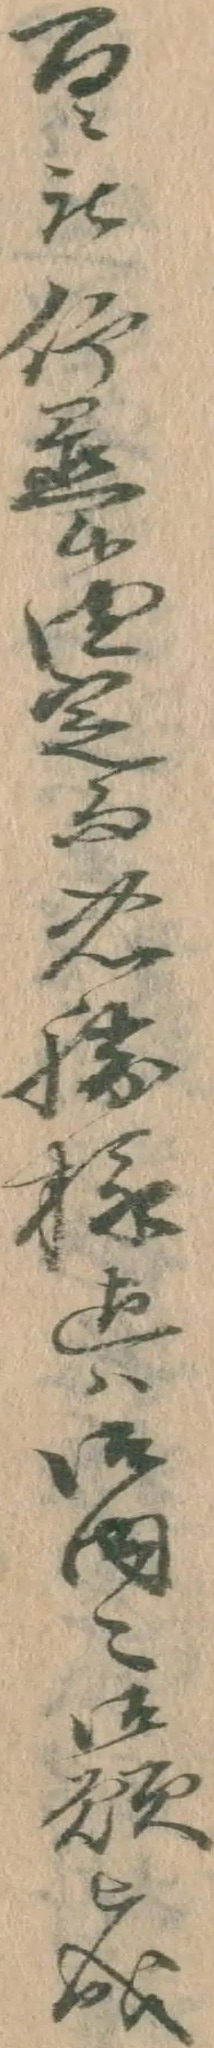間に被仰置候由定而忠勝様迄は御内々御願被成
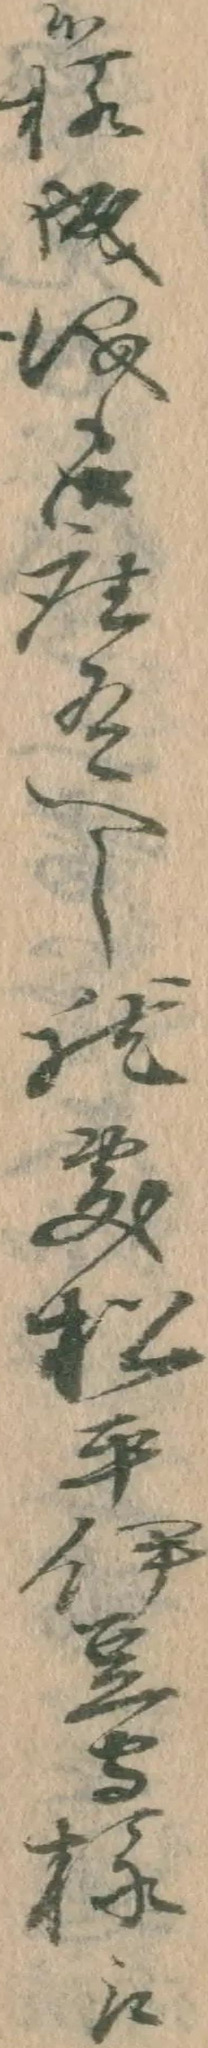候様成儀も御座有へし然処松平伊豆守様江
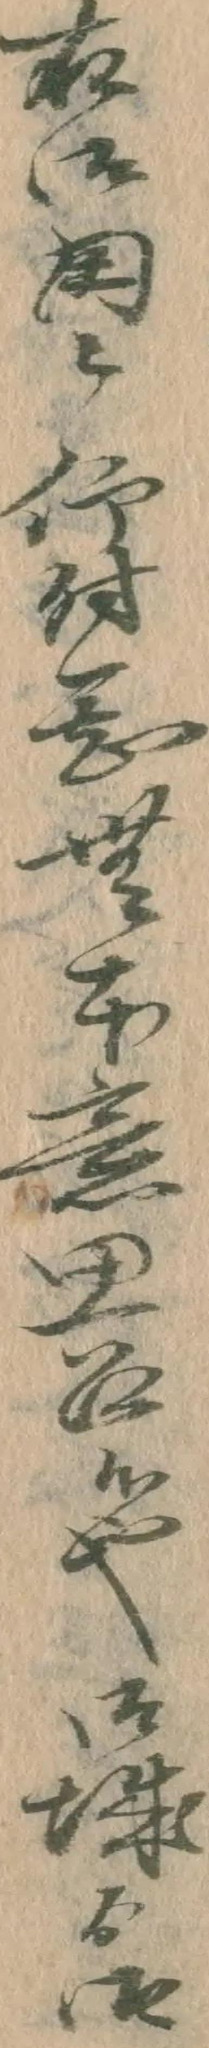右御用被仰付甚無本意思召候也御城ゟ御
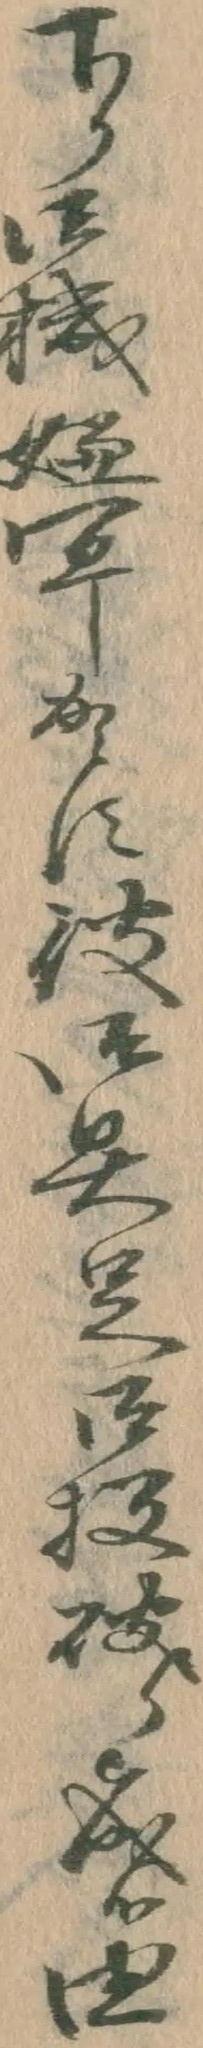下り御機嫌宜しからす彼御具足御投破り被成候由
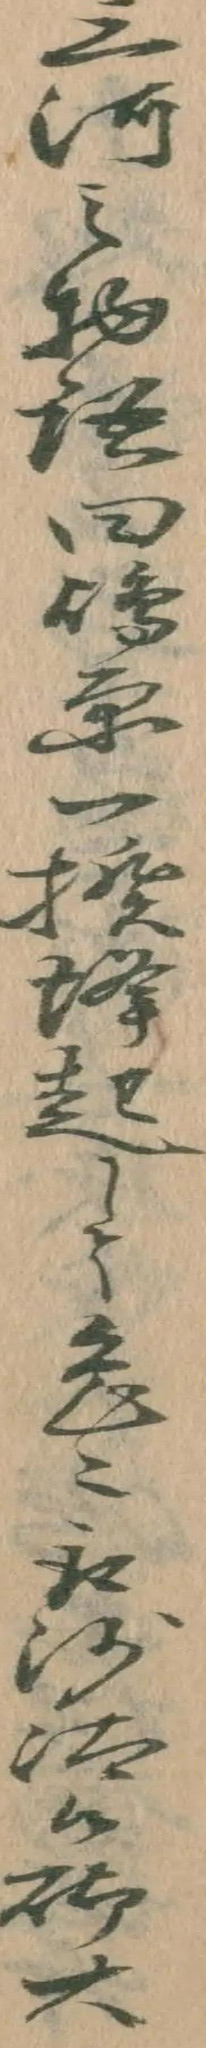三河之物語曰島原一揆蜂起して急に取沙汰候砌大
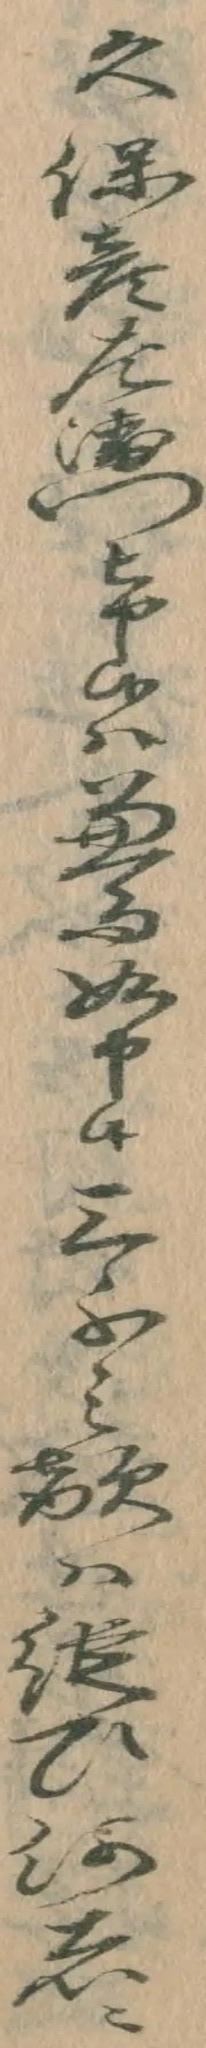久保彦左衛門被申候は兼而如申候三千之敵は従ひ何者に
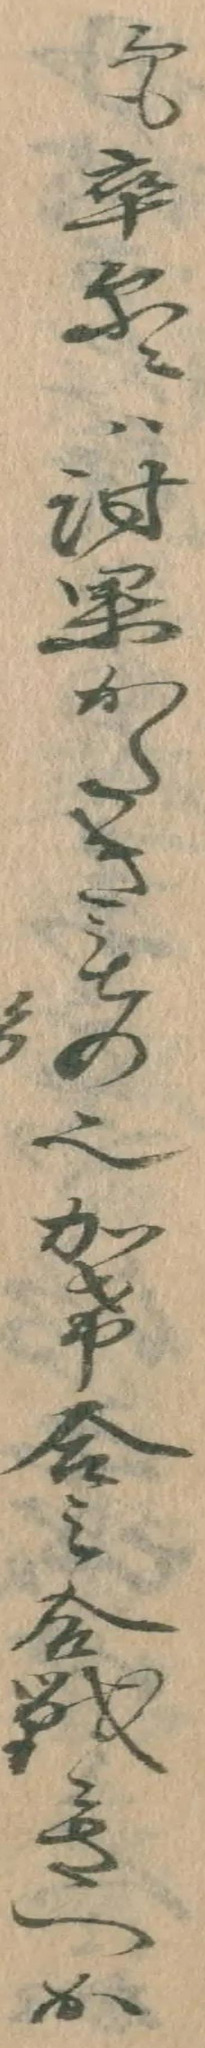而も卒爾には討果かたきもの也かけ合之合戦にさへか
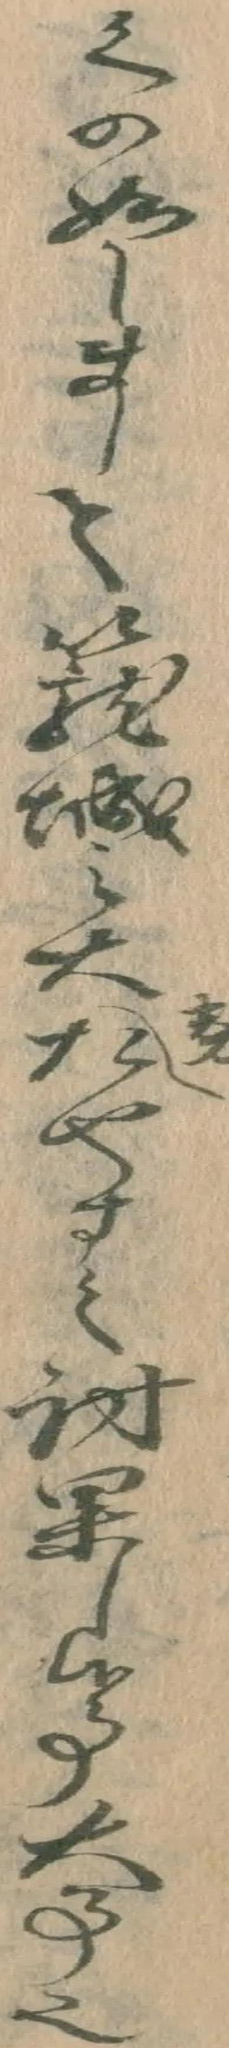くの如しまして籠城之大たやすく討果し候事大事也
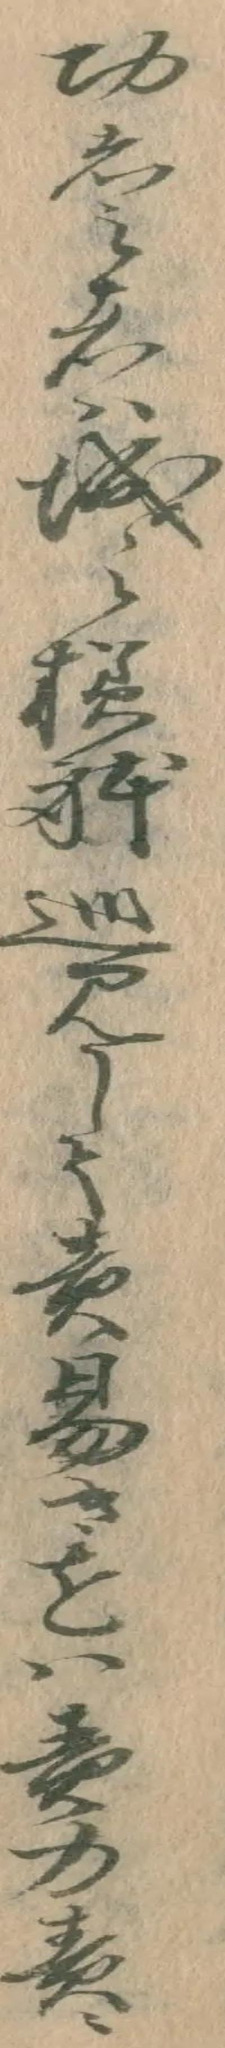功者之者は城之様体巡見して責易きをは責力責に
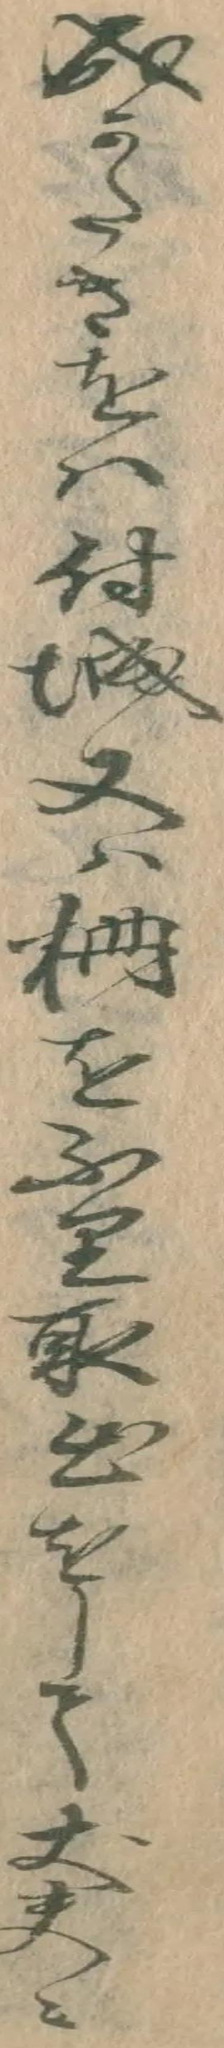成かたきをは付城又は柵をふり取出をして丈夫に
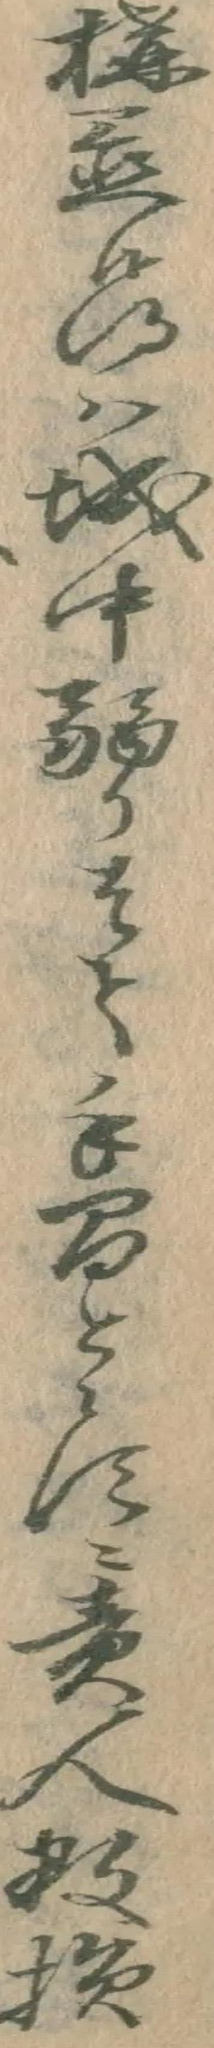構置候得は城中弱りはて手間とらすに責人数損
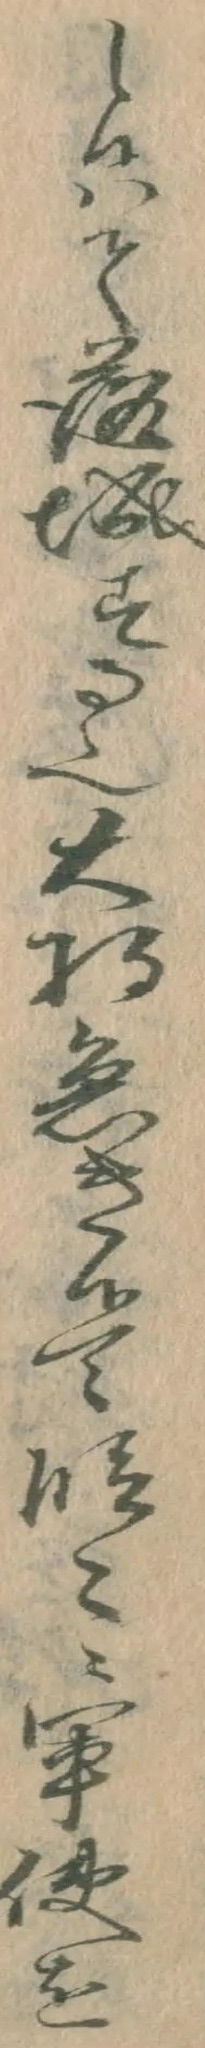し候はて落城する也大将急き候て段々に軍使を
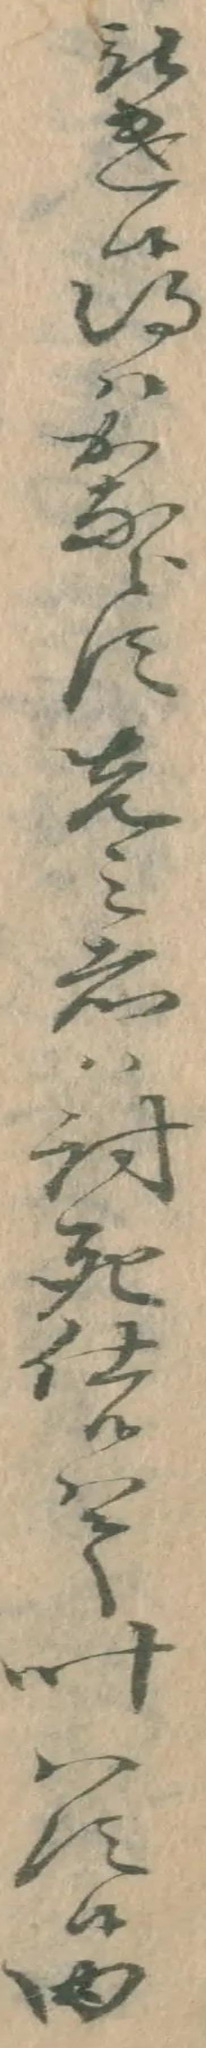被遣候得はかならす先之者は討死仕候はて叶はす候由
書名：切支丹御退治記 49巻. [3]
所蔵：国立国会図書館 National Diet Library, JAPAN
